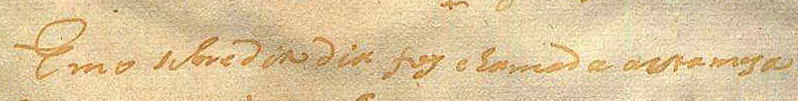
Em o sobredito dia foy chamado a esta meza
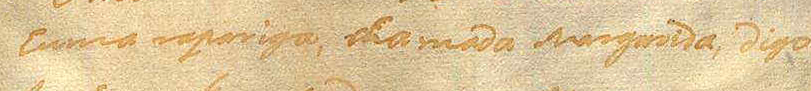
huma rapariga, chamada Margarida, digo
